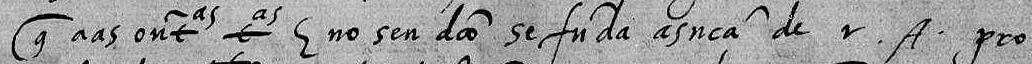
q̄ aas outras tas E no seu dcō se fūda a snçā de v A. pro
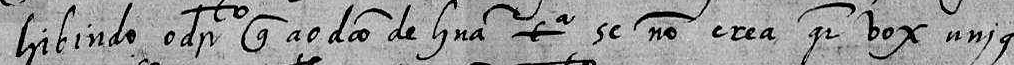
hibindo o drto q̄ ao dc̄o de huā ta se n̄o crea q̄i vox unjꝯ
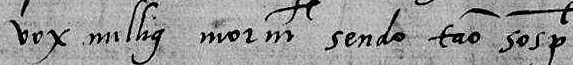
vox milliꝯ mormte sendo tão sospto
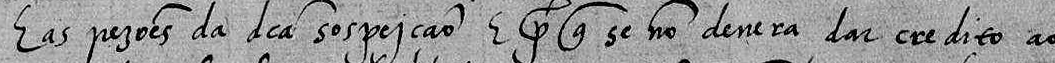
E as rezoẽs da dcā sospejção E p̄oq̄ se n̄o deuera dar credito ao
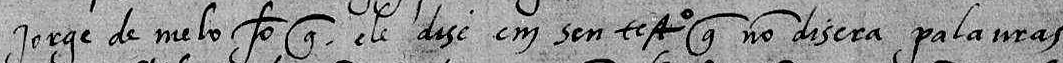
Jorge de melo s̄o q̄ ele dise em seu testo q̄ nō disera palauras
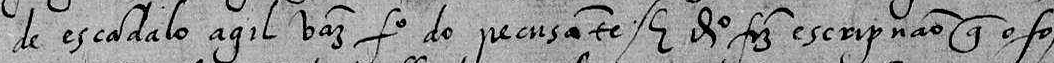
de escādalo a gil vaz̄ fo do recusāte / E do frz̄ escripuão q̄ o foj
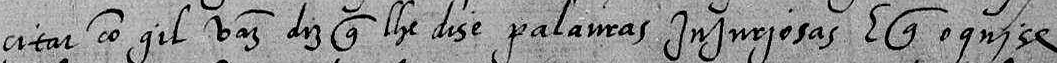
citar c̄o gil vaz̄ diz q̄ lhe dise palauras JnJurjosas E q̄ o qujse
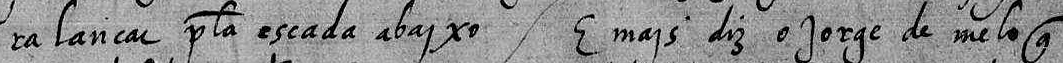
ra lançar p̄la escada abajxo / E majs diz o Jorge de melo q̄
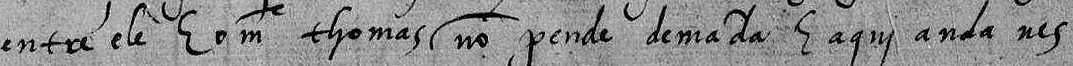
entre ele E o mte thomas n̄o pende demāda E aquj anda nes
